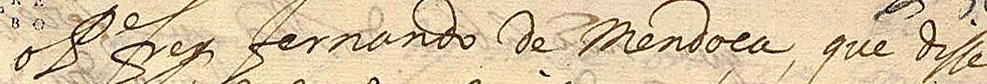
o Pe frey fernando de Mendoça, que disse
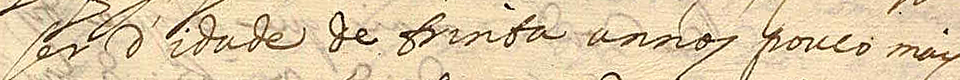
ser d'idade de trinta annos pouco mais
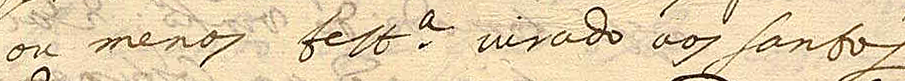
ou menos test.a iurado aos santos
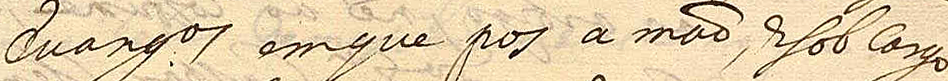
euang.os em que pos a mão, E sob cargo
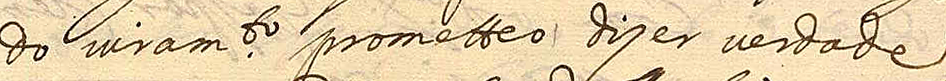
do iuram.to prometteo dizer uerdade,
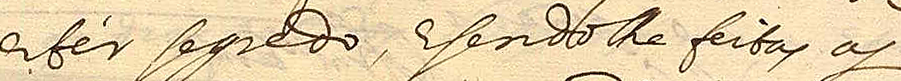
E ter segredo, E sendolhe feitas as
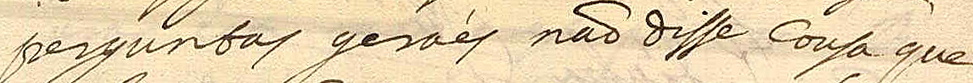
perguntas geraes não disse cousa que
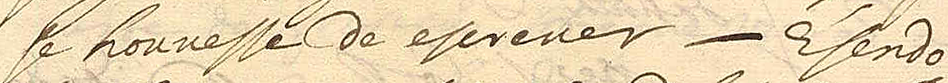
se houvesse de escreuer - E sendo
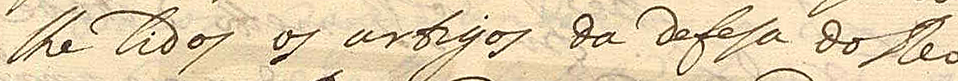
lhe lidos os artigos da defesa do Reo
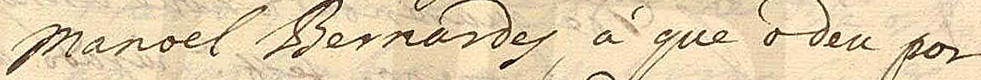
Manoel Bernardes, a que o deu por
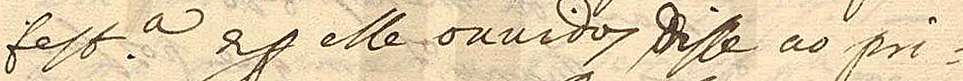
test.a E ꝑ elle ouuidos disse ao pri
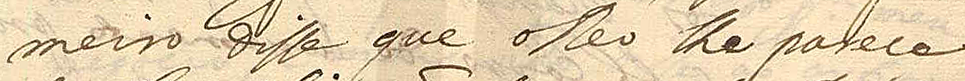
meiro disse que o Reo lhe pareçe
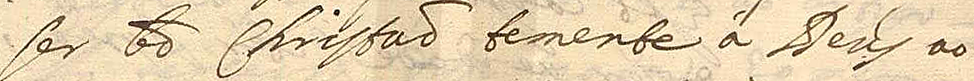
ser bō Christão temente á Deus ao
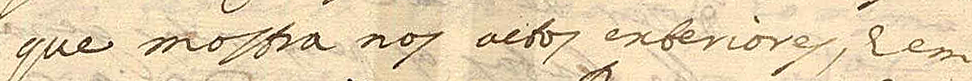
que mostra nos actos exteriores, E em
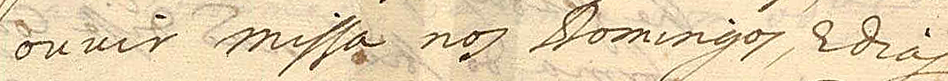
ouuir missa nos Domingos, E dias
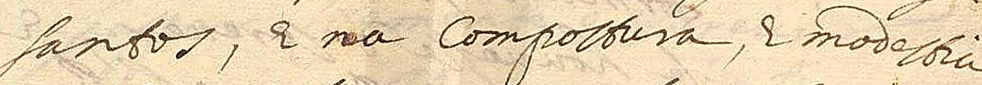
santos, E na compostura, E modestia
